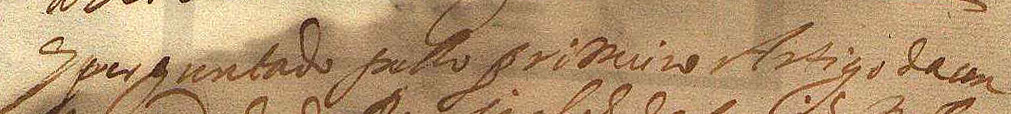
E perguntado pello primeiro Artigo da con
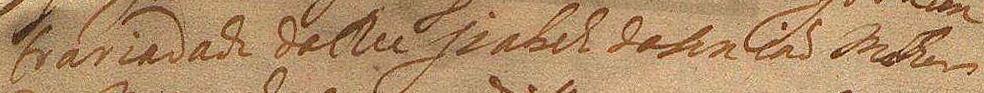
trariadade da Ree Jsabel dasençaõ molher
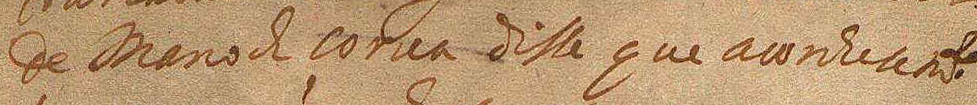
de Manoel correa disse que a conhese m.to
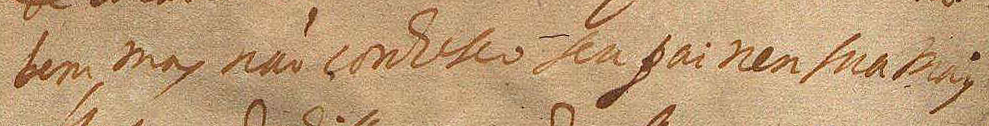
bem mas naõ conheseo seu pai nen sua may
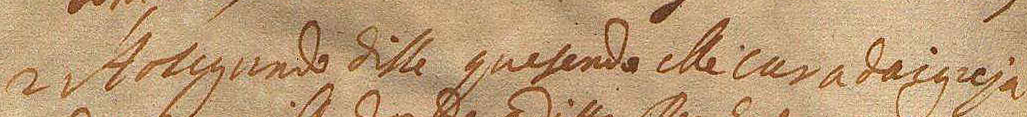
2 Ao segundo disse que sendo elle cura da igreja
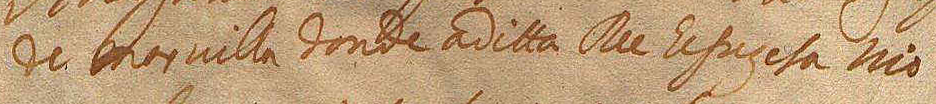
de maruilla donde a ditta Ree he fregesa uio
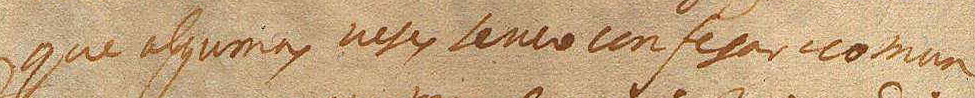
que algumas ueses se ueo confesar e comun
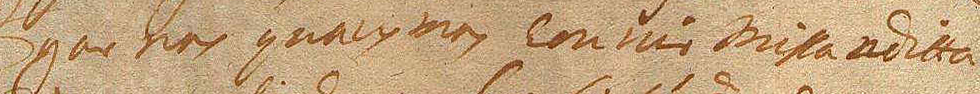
gar nas quaresmas e ouuir missa a ditta
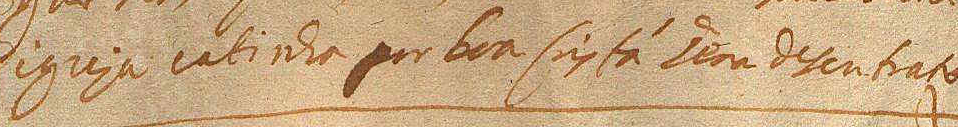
igreja e a tinha por boa Cristã E era de seu trato
